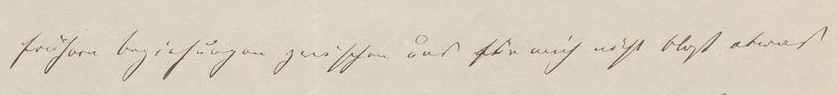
frühern Beziehungen zwischen uns für mich nicht bloß etwas
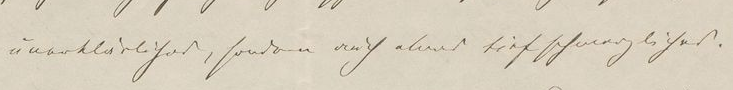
unerklärliches, sondern auch etwas tiefschmerzliches.
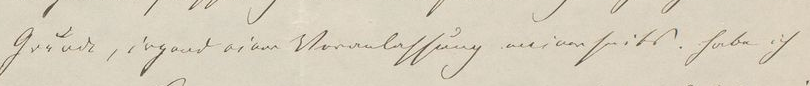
Grunde, irgend eine Veranlassung meinerseits. Habe ich
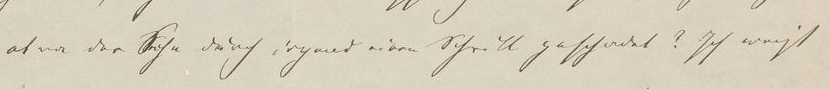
etwa der Sache durch irgend einen Schritt geschadet? Ich weiß
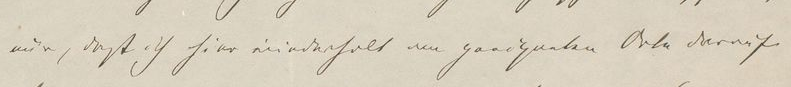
nur, daß ich hier wiederholt am geeigneten Orte darauf
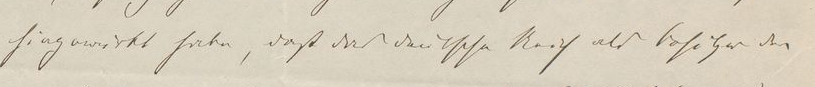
hingewirkt habe, daß das deutsche Reich als Besitzer der
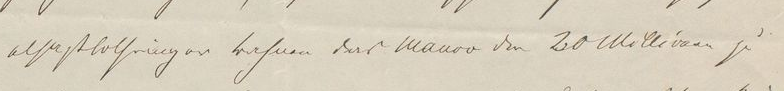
elsasslothringer Bahnen das Manco der 20 Millionen zu
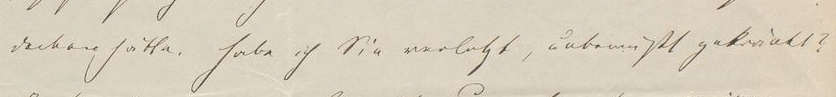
decken hätte. Habe ich Sie verletzt, unbewußt gekränkt?
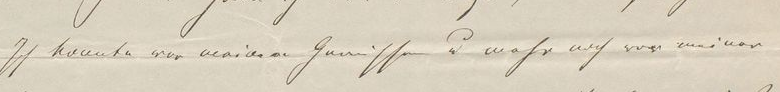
Ich konnte vor meinem Gewissen u mehr noch vor meiner
